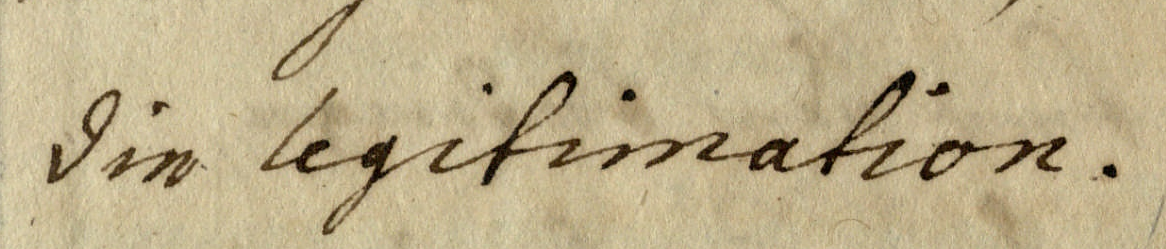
die legitimation.
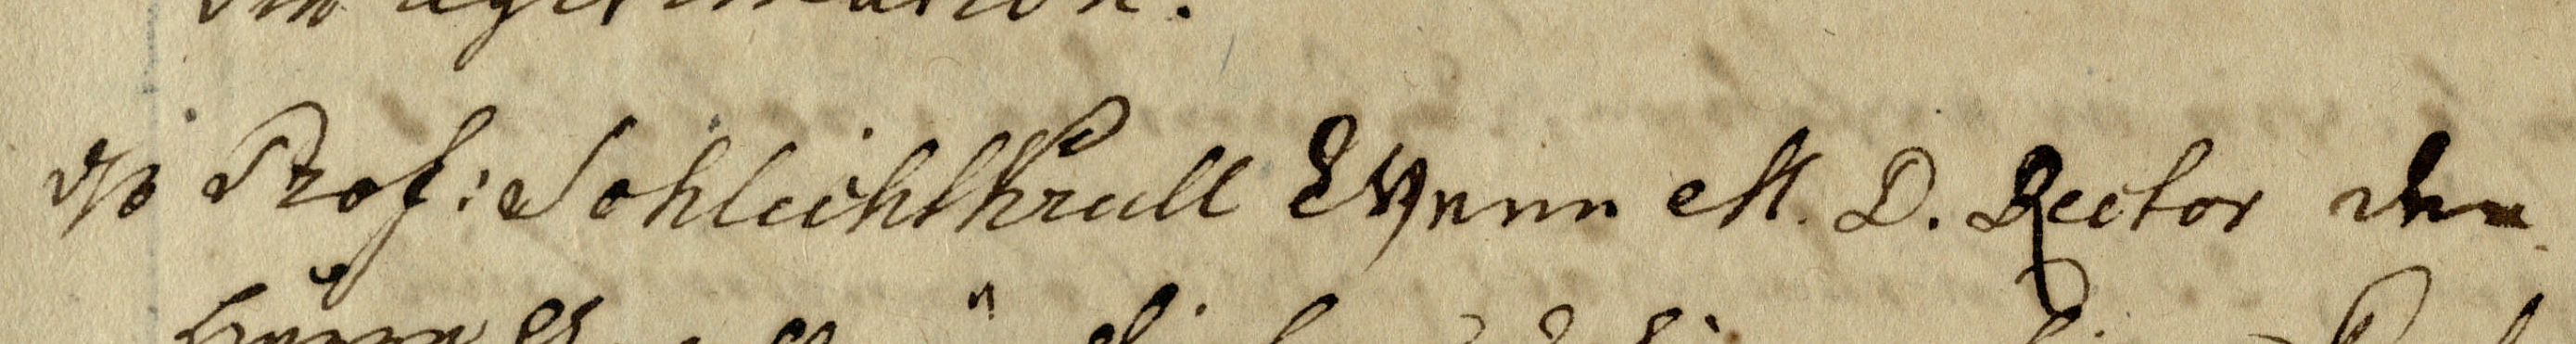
dh Prof. Schlichtkrull Wenn M. D. Rector den
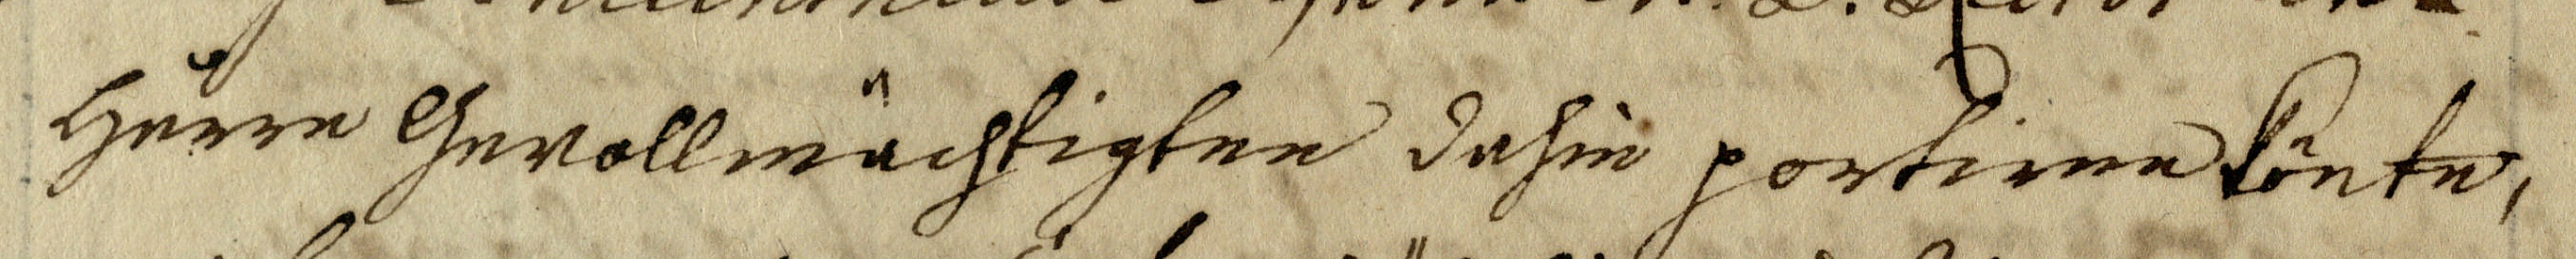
Herrn Gevollmächtigten dahin portiren könte,
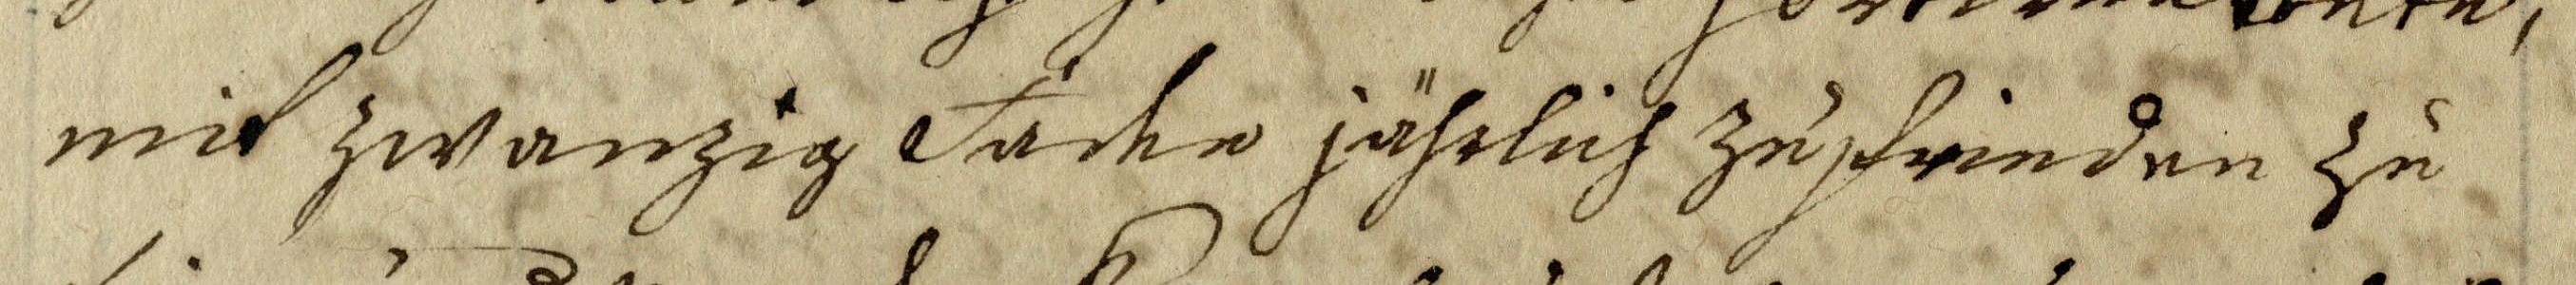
mit zwanzig Faden jährlich zufrieden zu
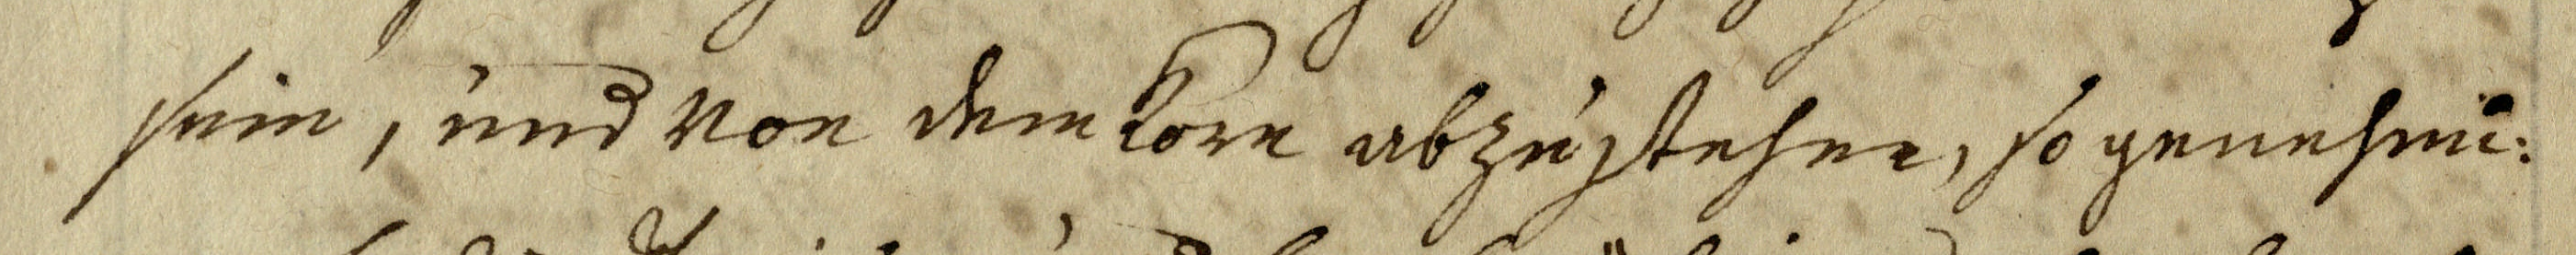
sein, und von dem Korn abzustehen, so genehmi¬
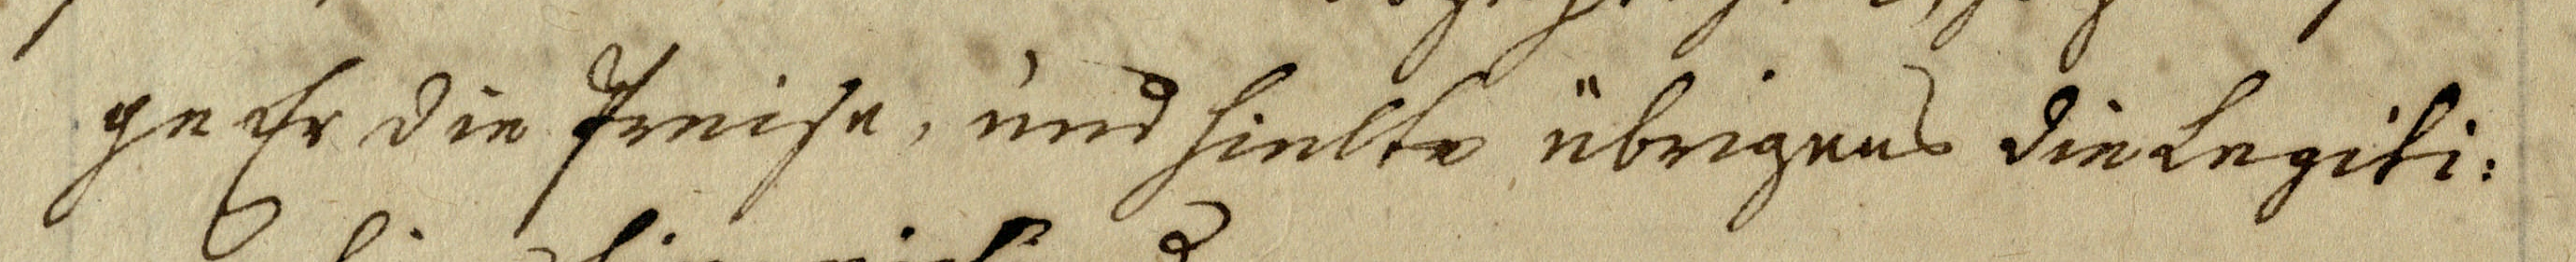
ge Er die Preise, und hielte übrigens die Legiti¬
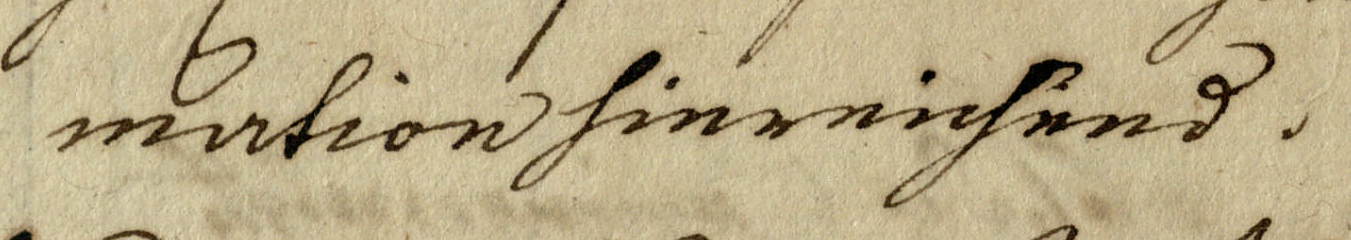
mation hinreichend.
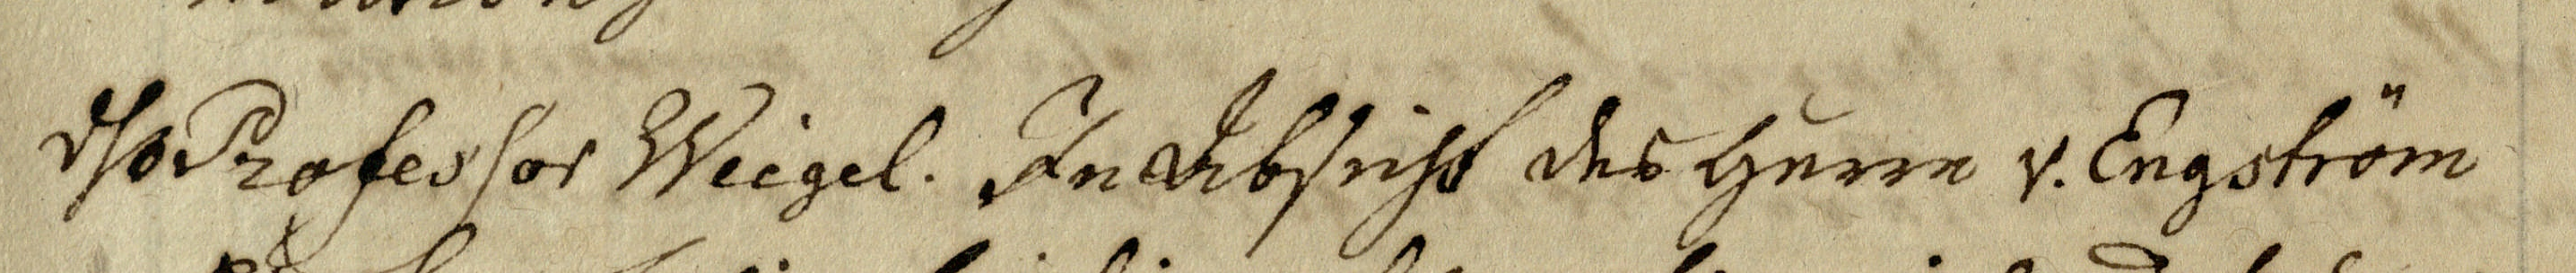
dh Professor Weigel. In Absicht des Herrn v. Engström
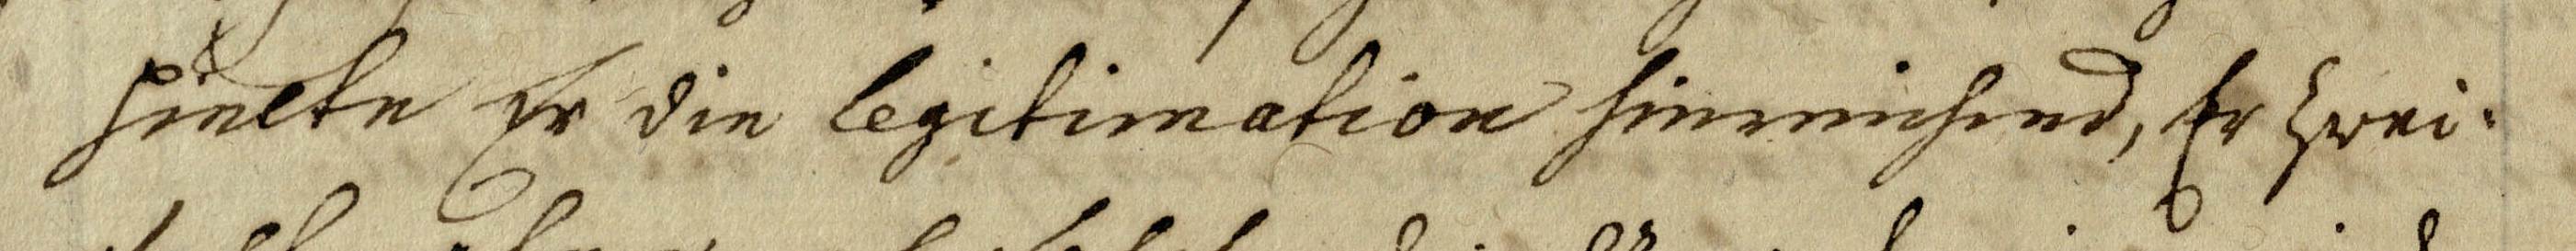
hielte Er die legitimation hinreichend, Er zwei¬
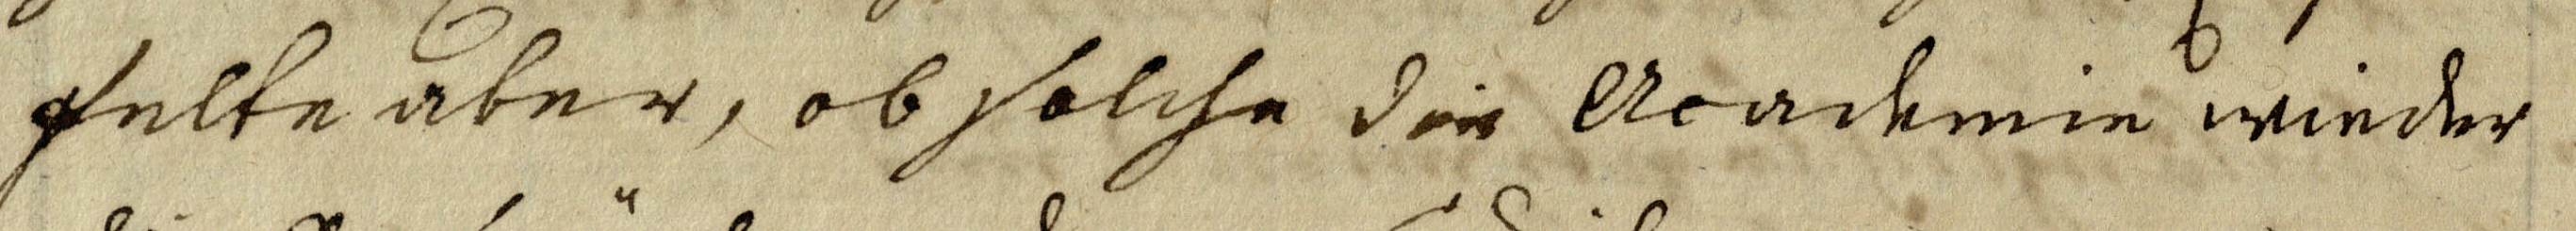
felte aber, ob solche die Academie wieder
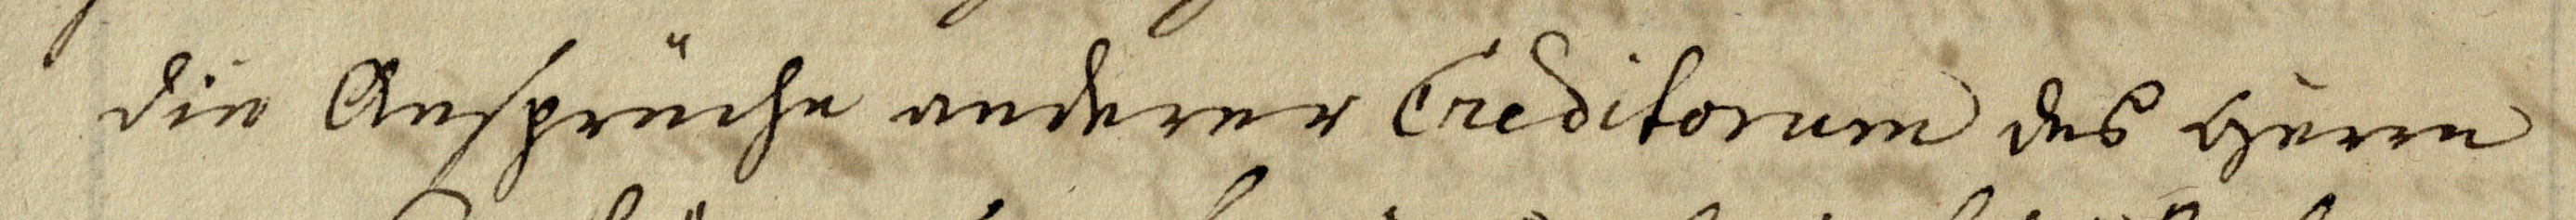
die Ansprüche anderer Creditorum des Herrn
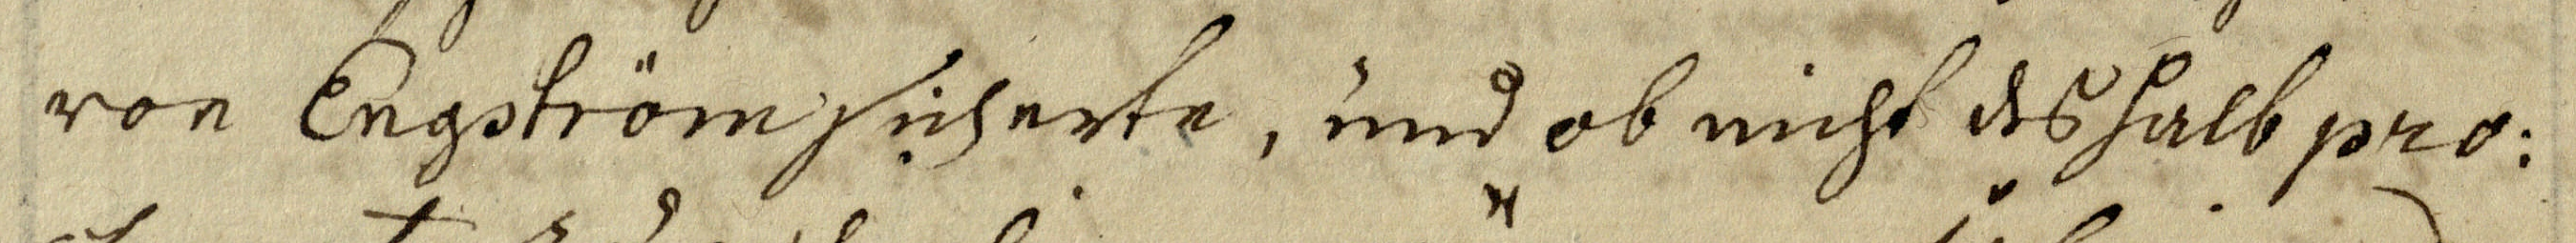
von Engström sicherte, und ob nicht deshalb pro¬
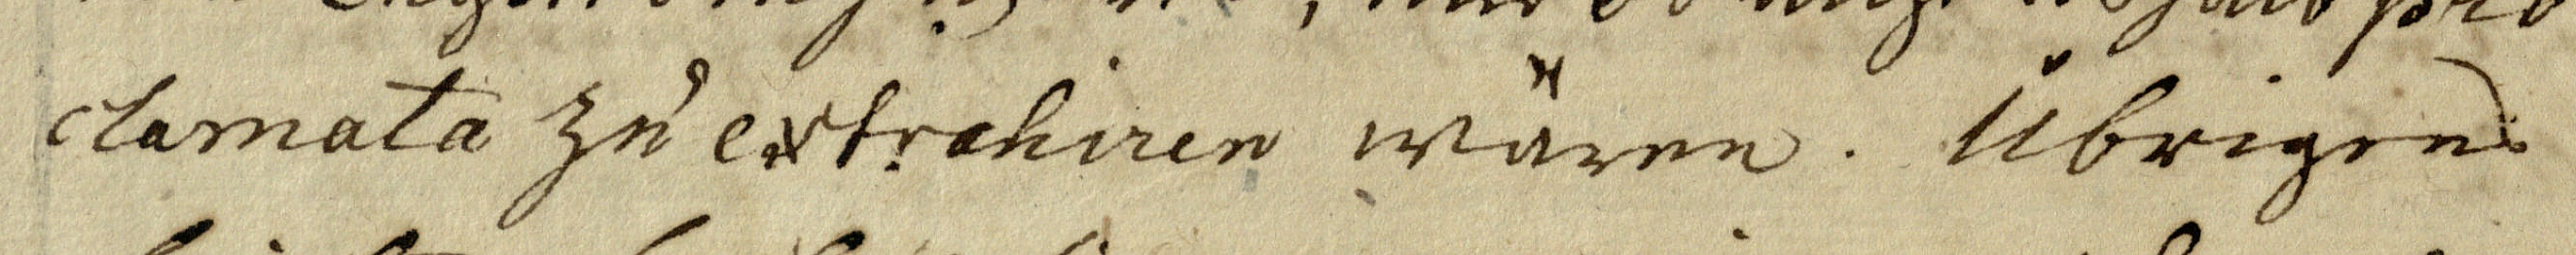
clamata zu extrahiren wären. Übrigens
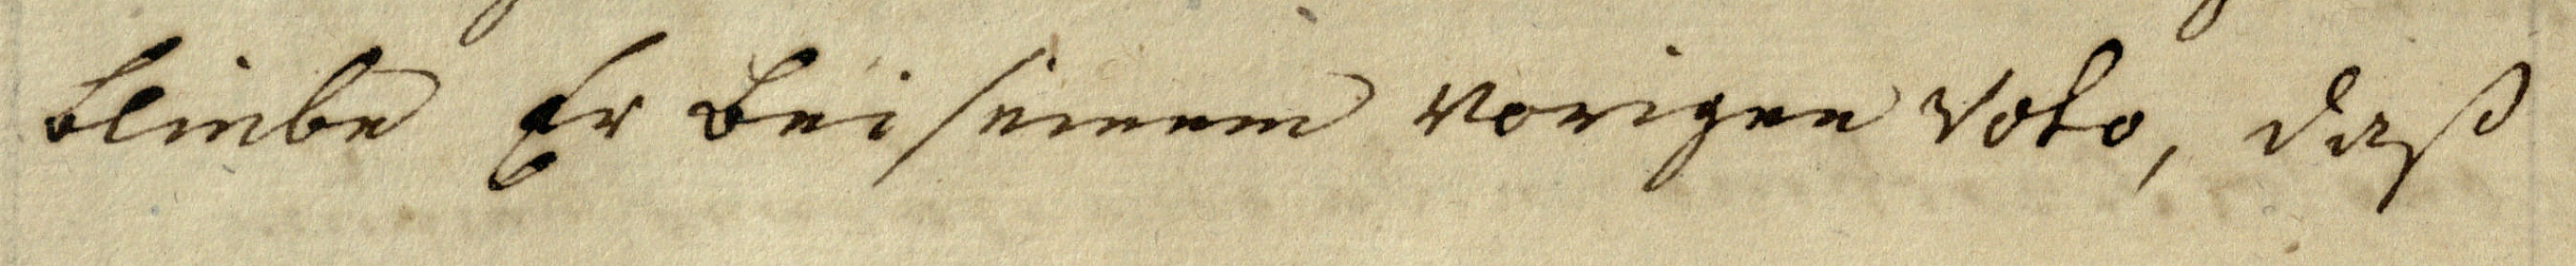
bliebe Er bei seinem vorigen Voto, daß
